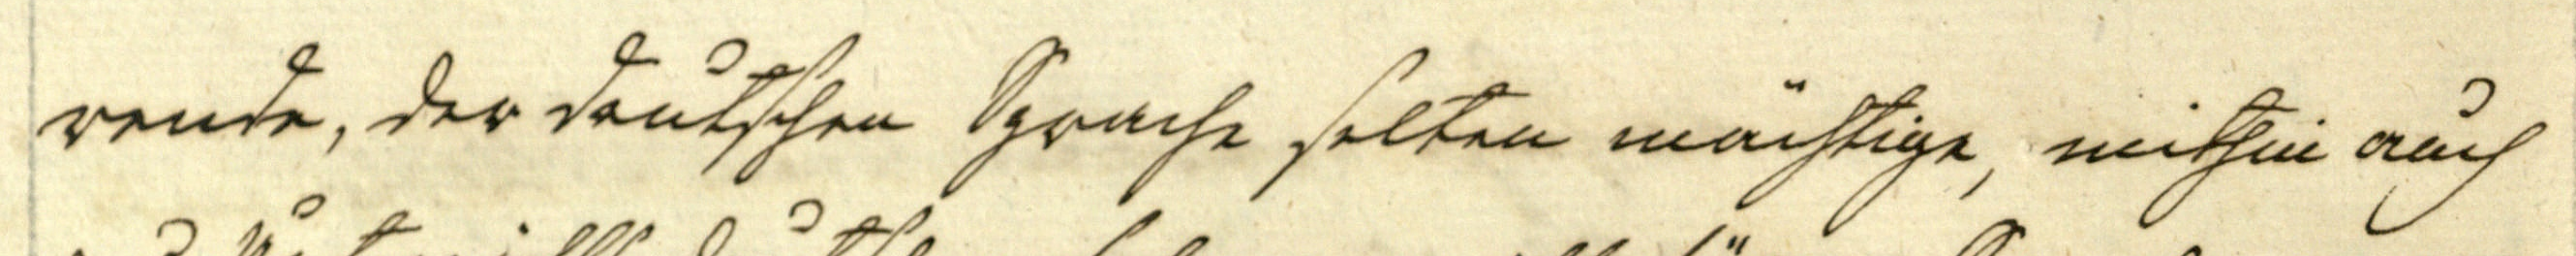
rende, der deutschen Sprache selten mächtige, mithin auch
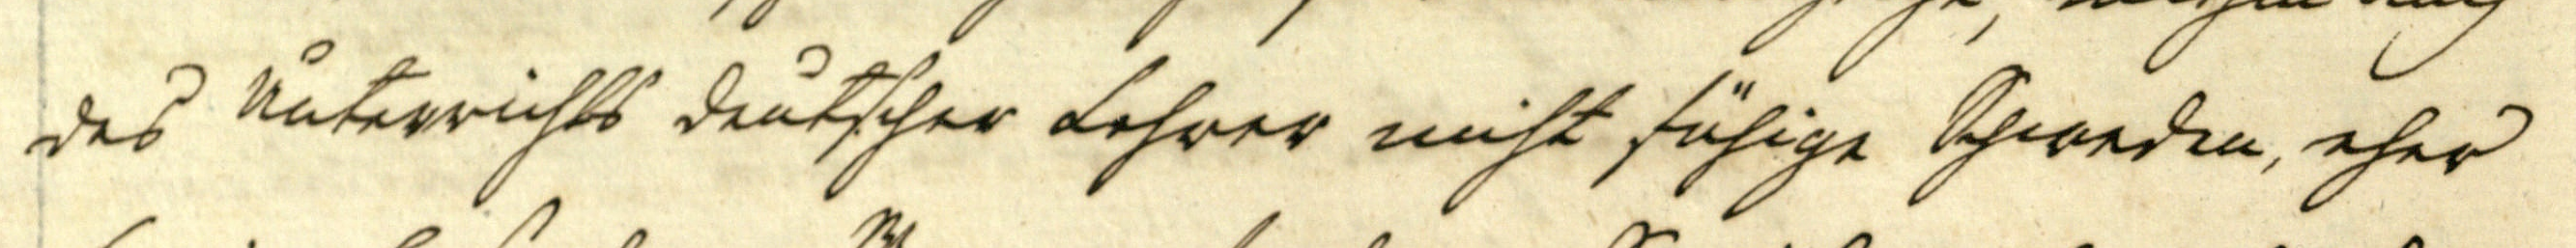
des Unterrichts deutscher Lehrer nicht fähige Schweden, eher
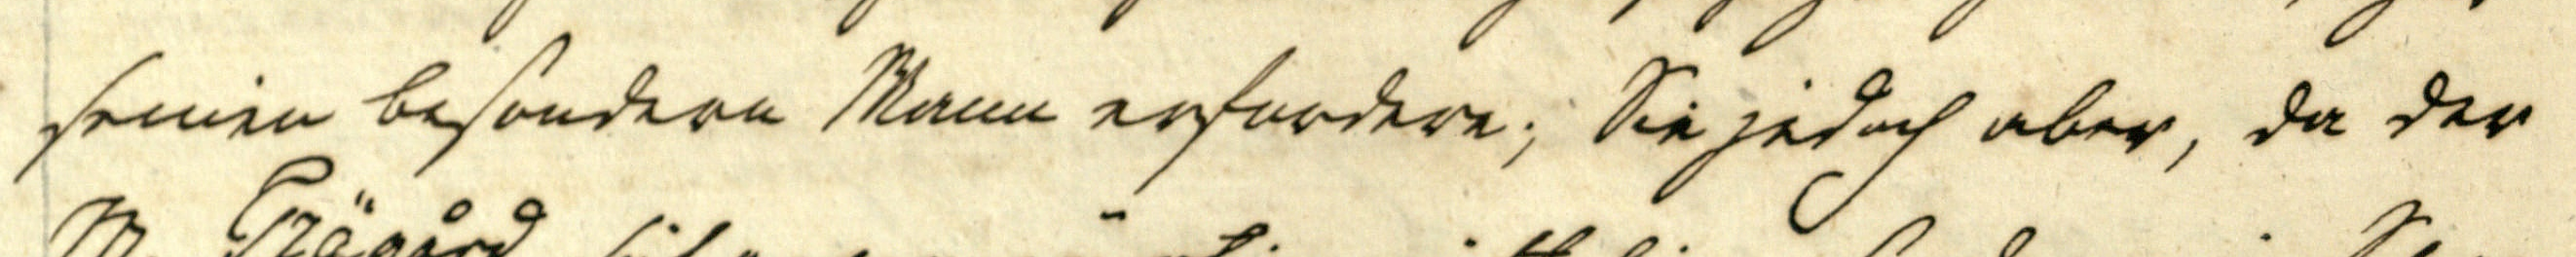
seinen besondern Mann erfordere, Sie jedoch aber, da der
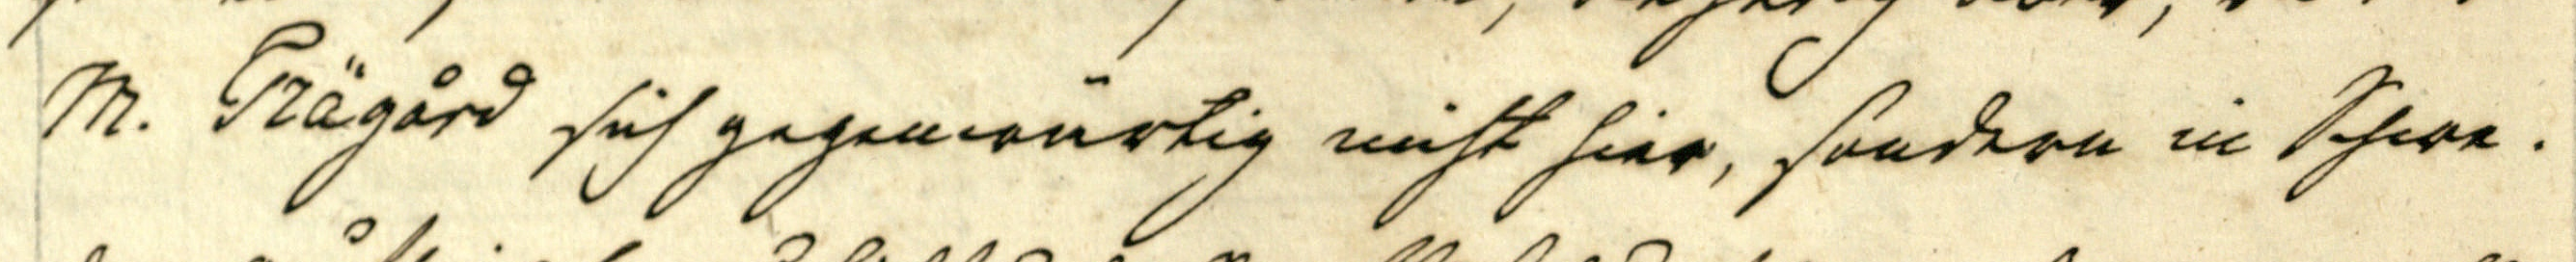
M. Trägård sich gegenwärtig nicht hier, sondern in Schwe¬
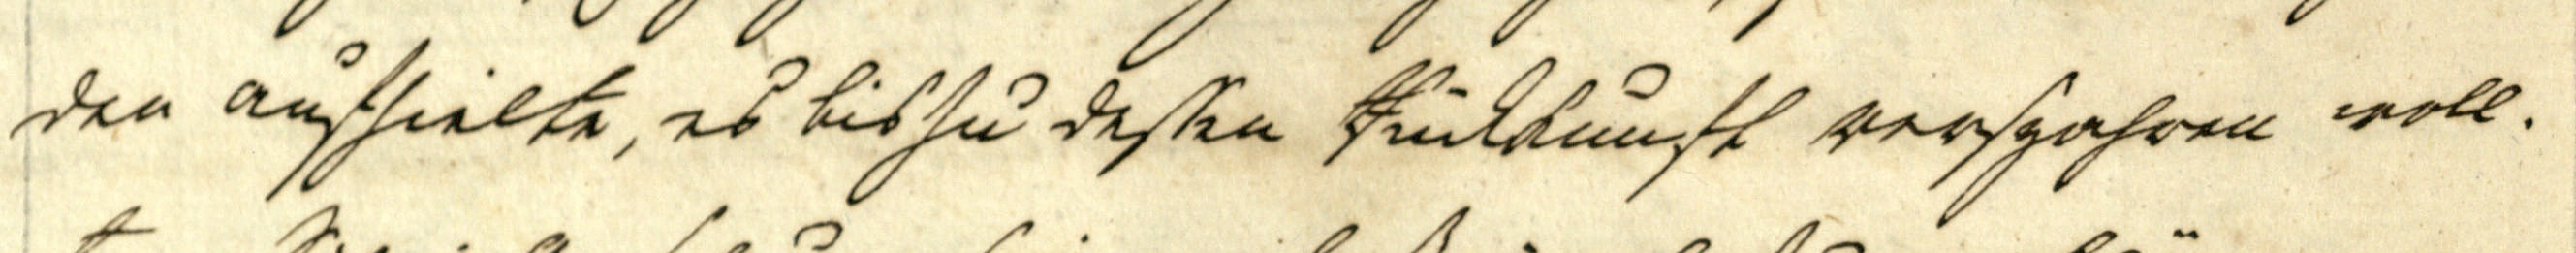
den aufhielte, es bis zu dessen Rückkunft verspahren woll¬
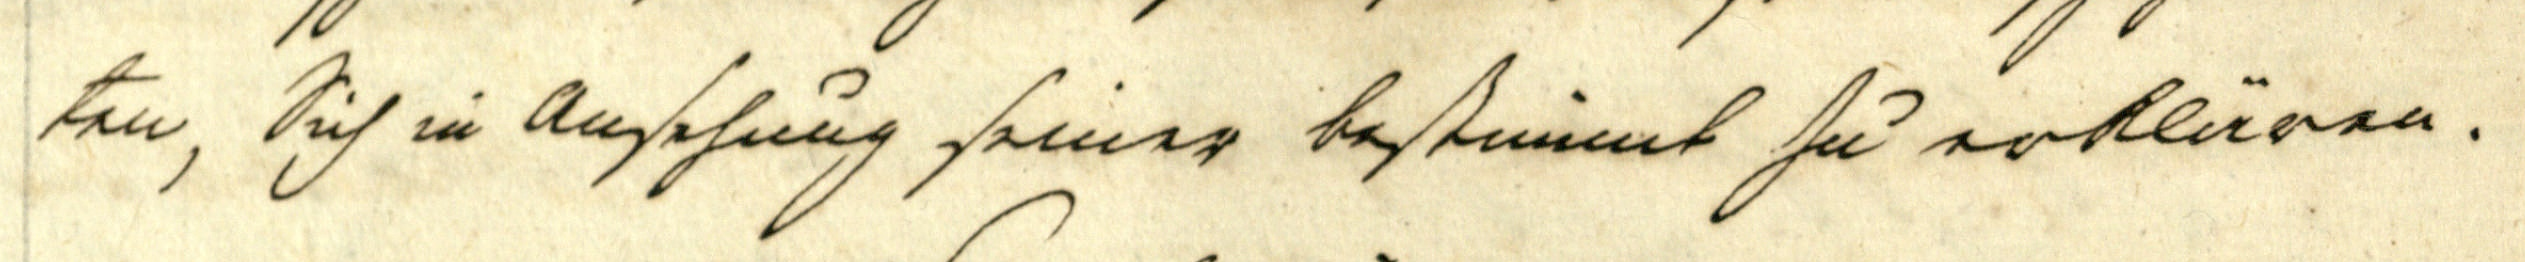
ten, Sich in Ansehung seiner bestimmt zu erklären.
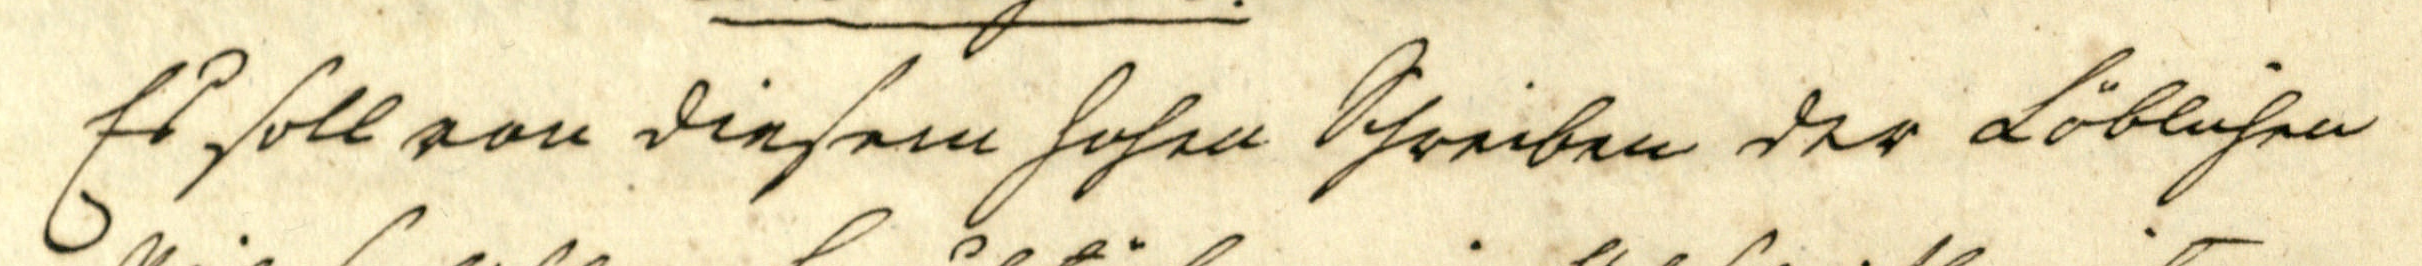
Es soll von diesem hohen Schreiben der Löblichen
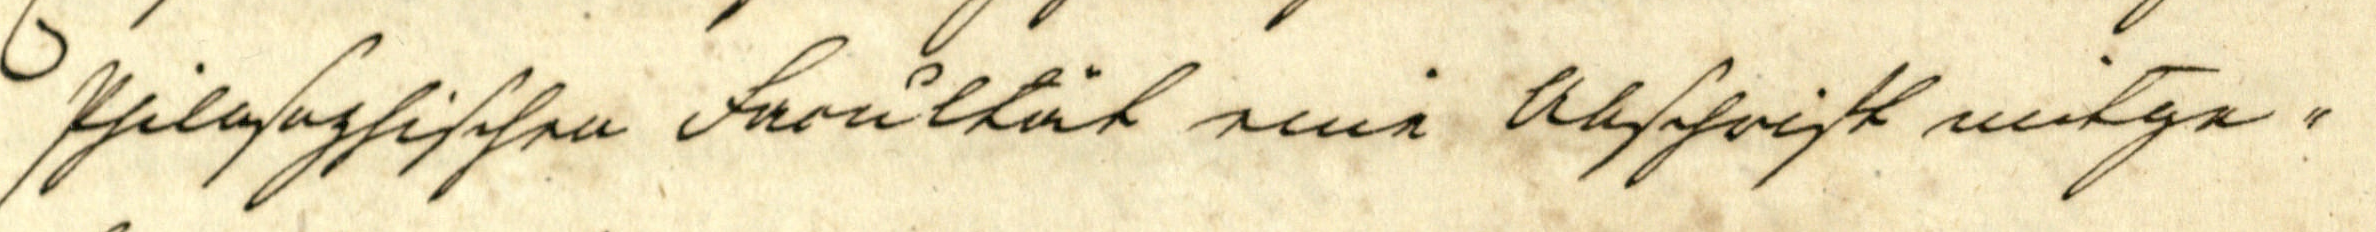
Philosophischen Facultät eine Abschrift mitge¬
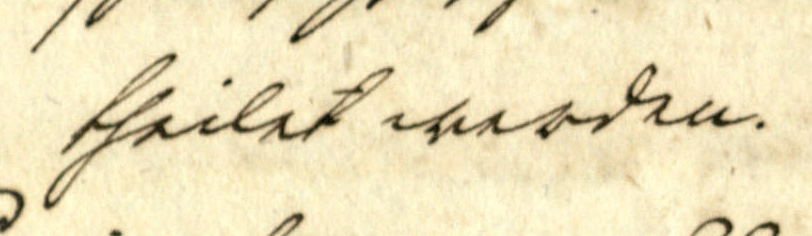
theilet werden.
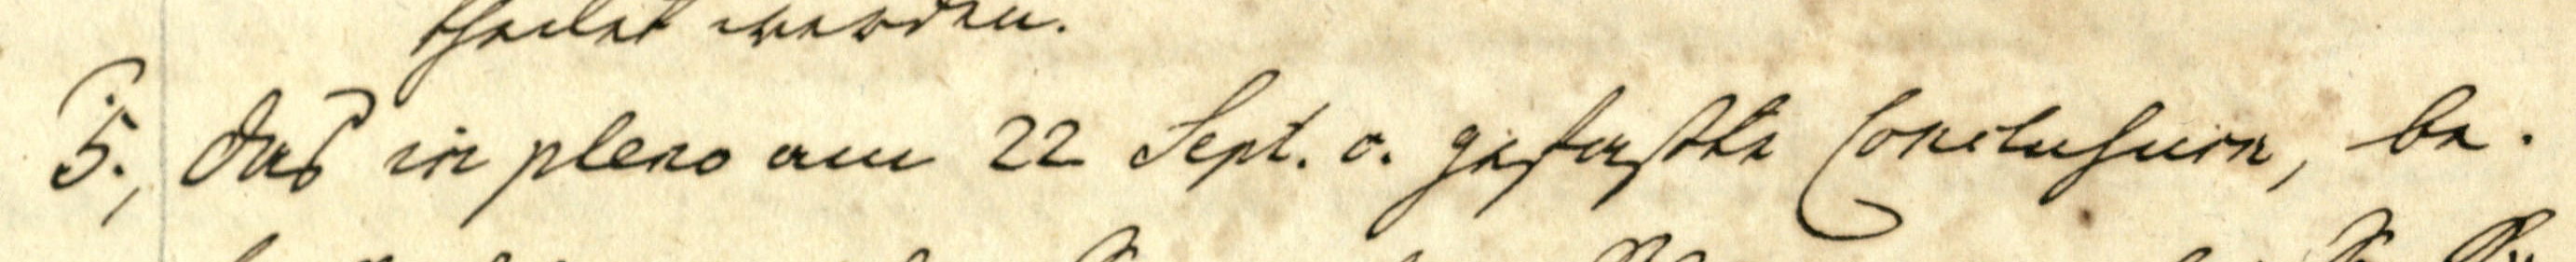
5. Das in pleno am 22. Sept. c. gefaßte Conclusum, be¬
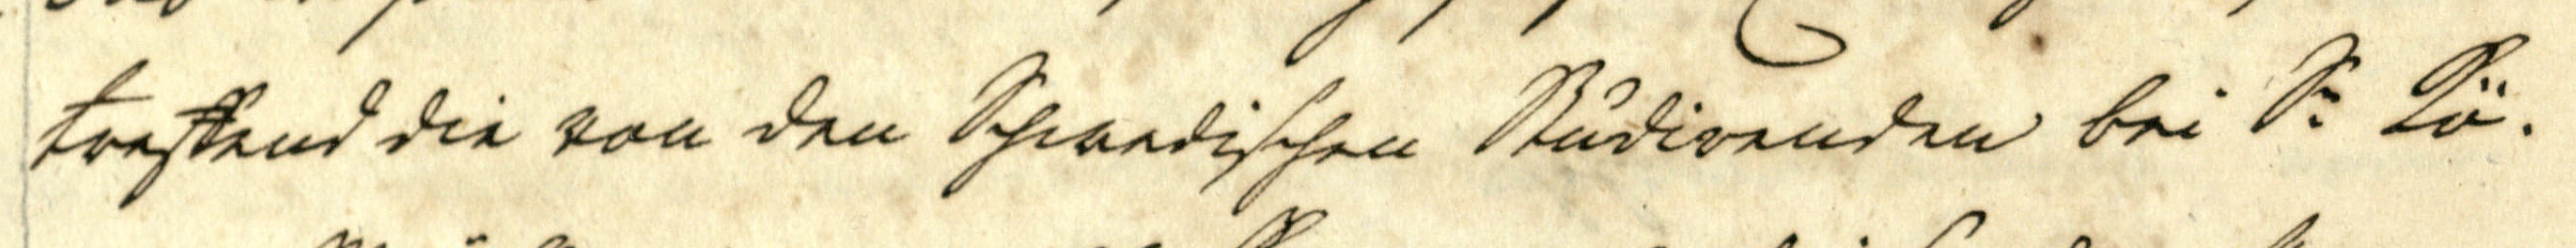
treffend die von den Schwedischen Studirenden bei Sr. Kö¬
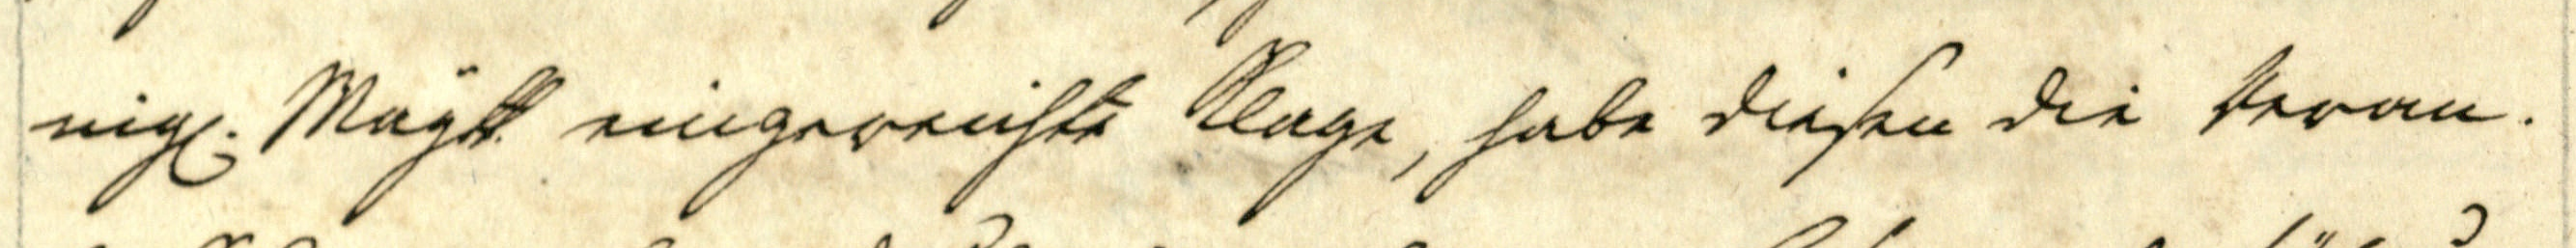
nigl. Maÿtt. eingereichte Klage, habe diesen die Veran¬
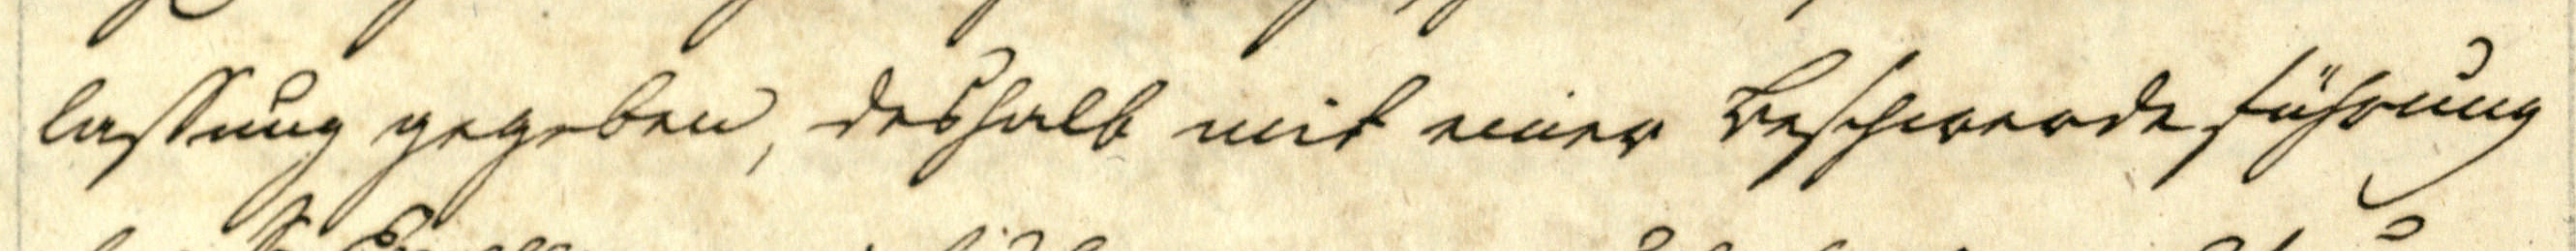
lassung gegeben, deshalb mit einer Beschwerdeführung
